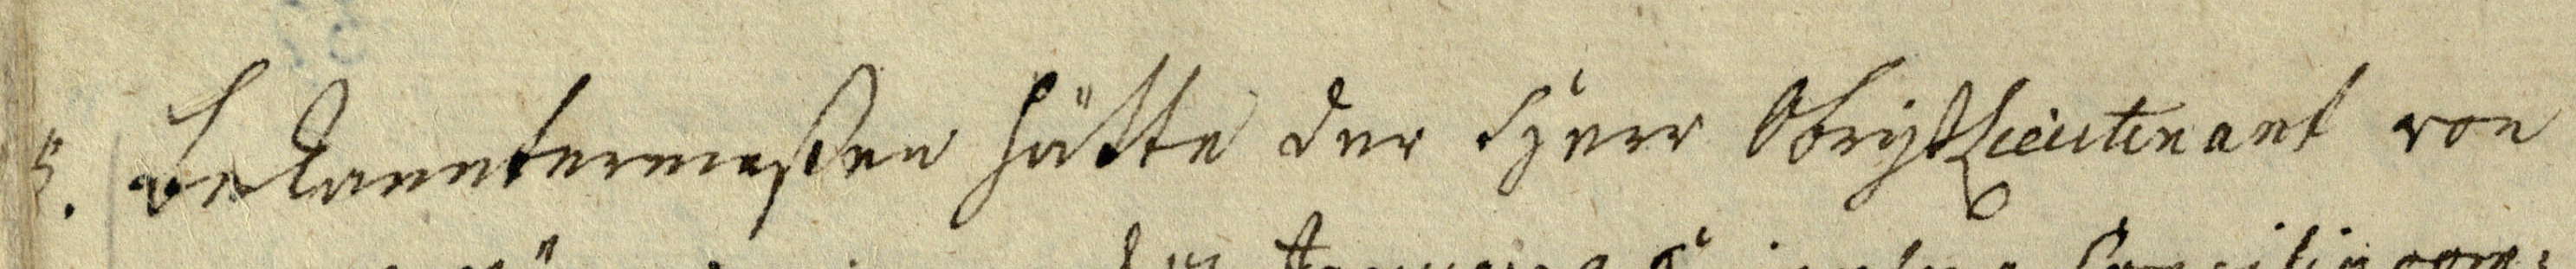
Bekanntermaßen hätte der Herr Obrist Lieutenant von
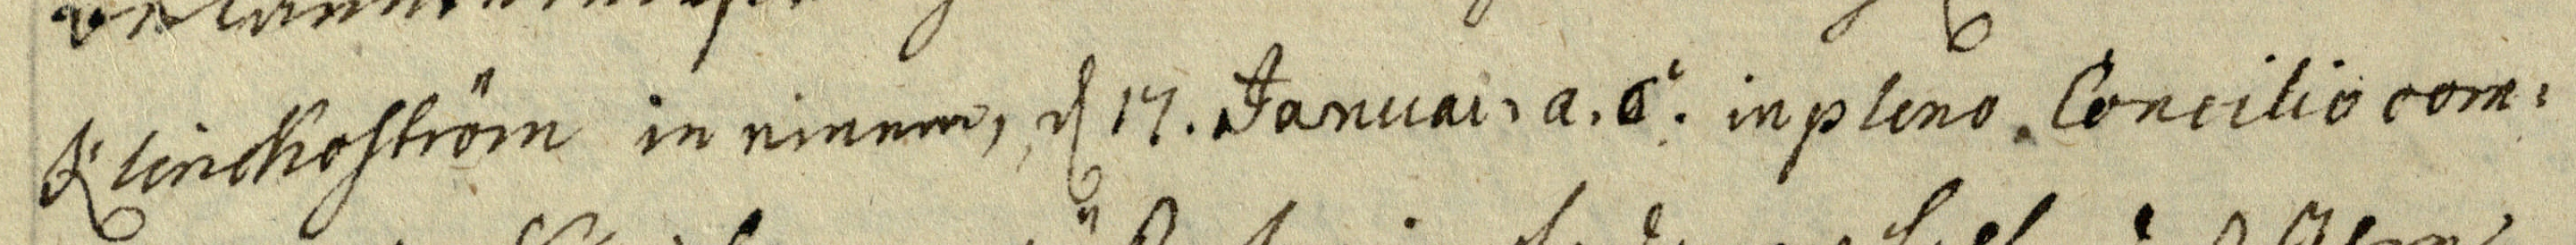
Klinckowström in einem, d. 17. Januar. a.c. in pleno Concilio com¬
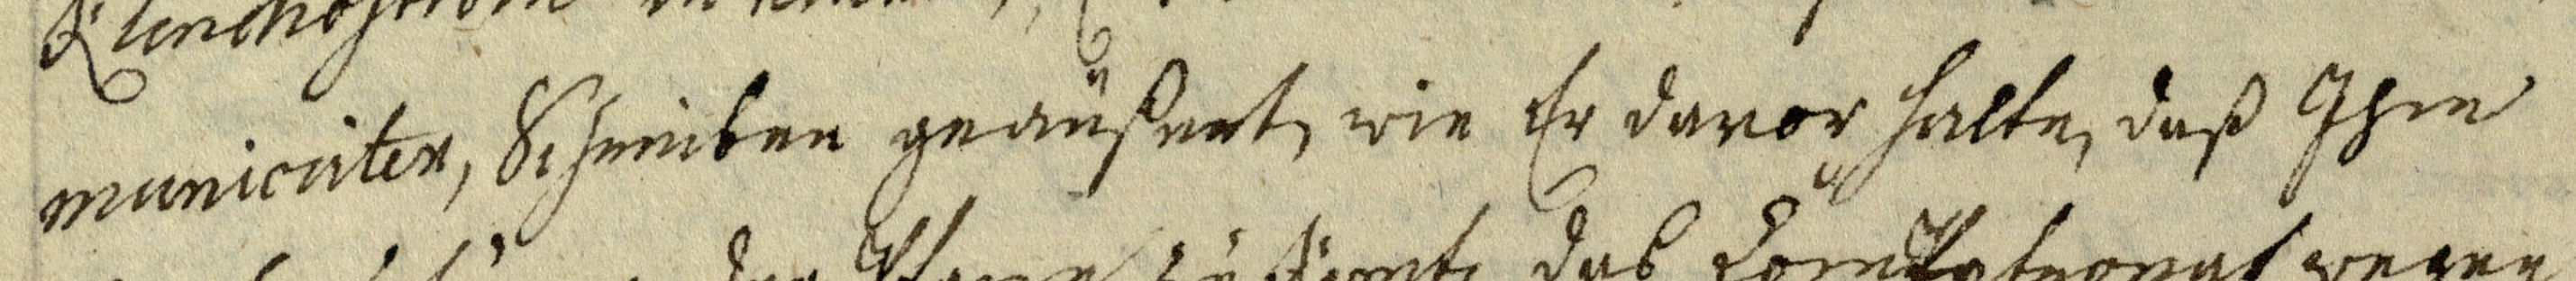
municirten, Schreiben geäußert, wie Er davor halte, daß Ihm
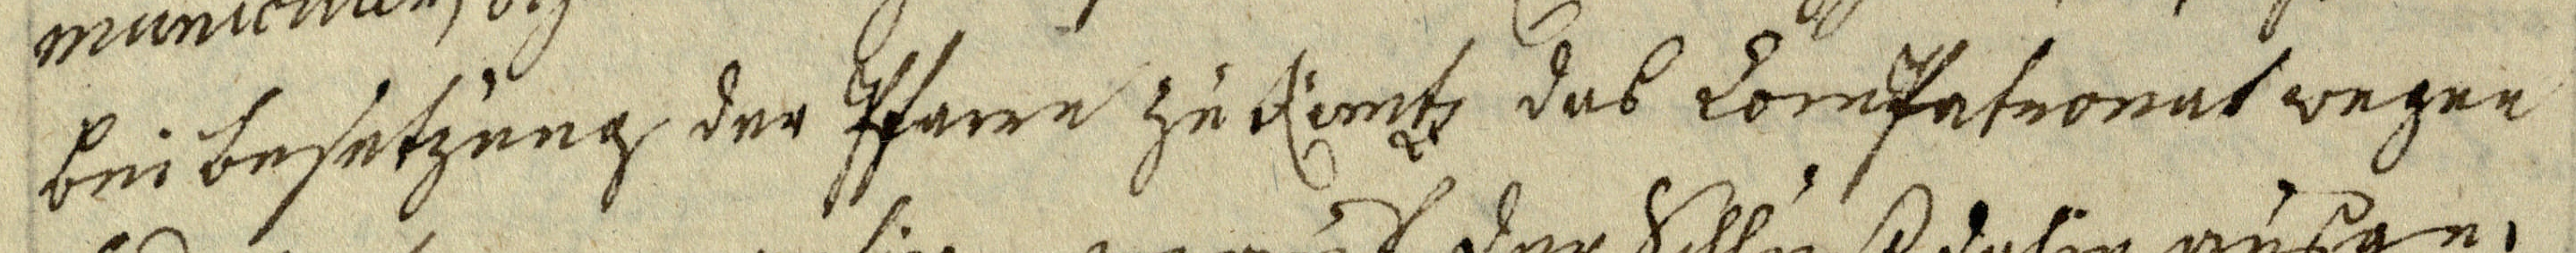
bei Besetzung der Pfarre zu Kemtz das CornPatronat wegen
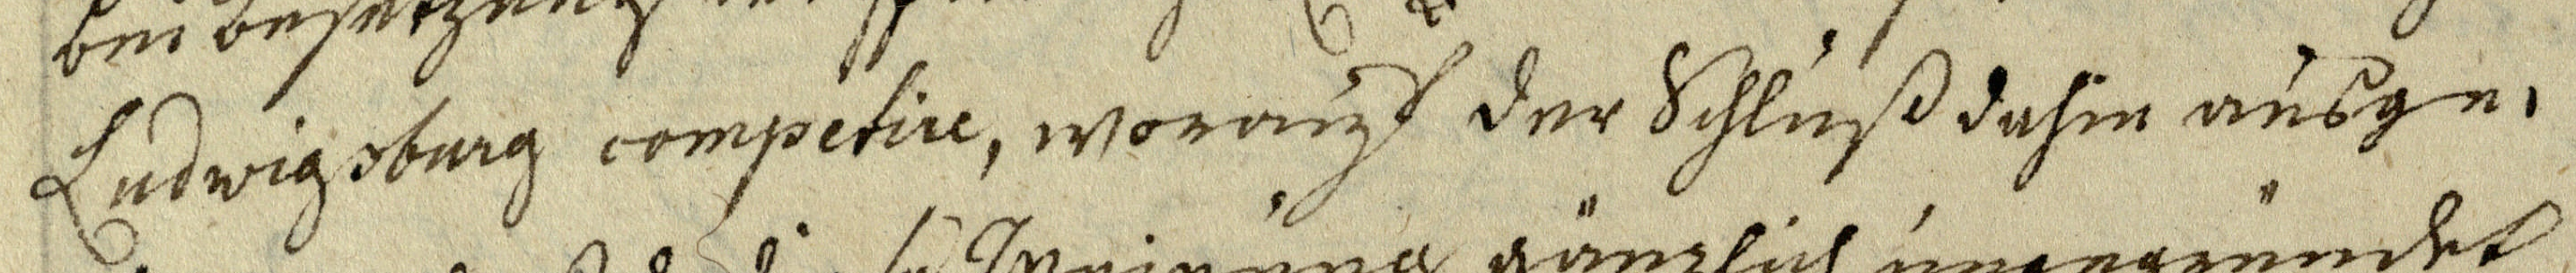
Ludwigsburg competire, worauf der Schluß dahin ausge¬
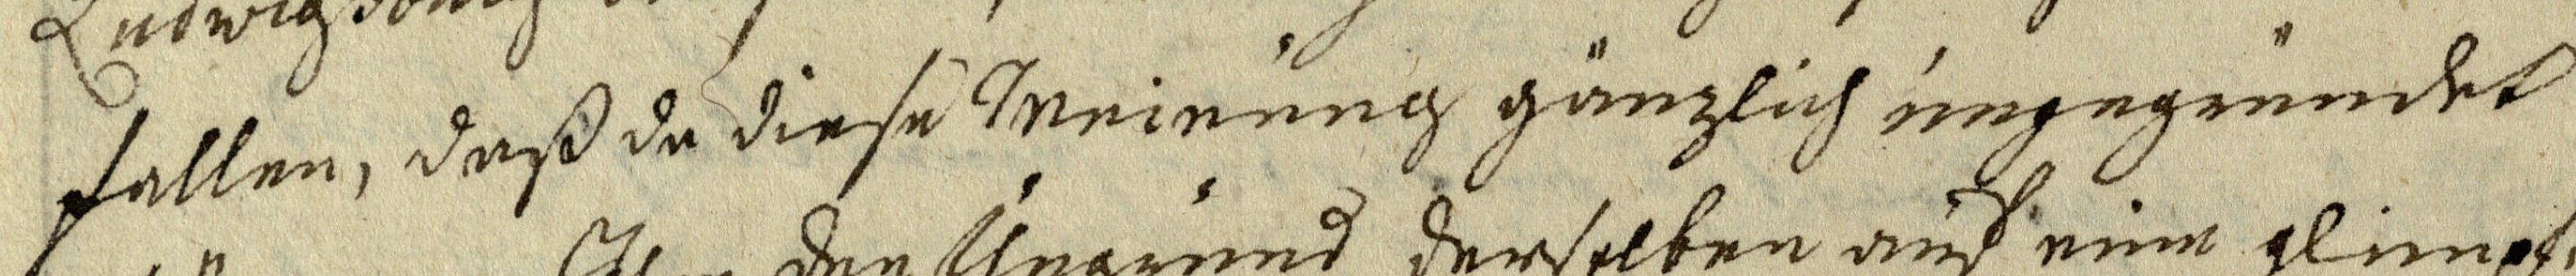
fallen, daß diese Meinung gänzlich ungegründet
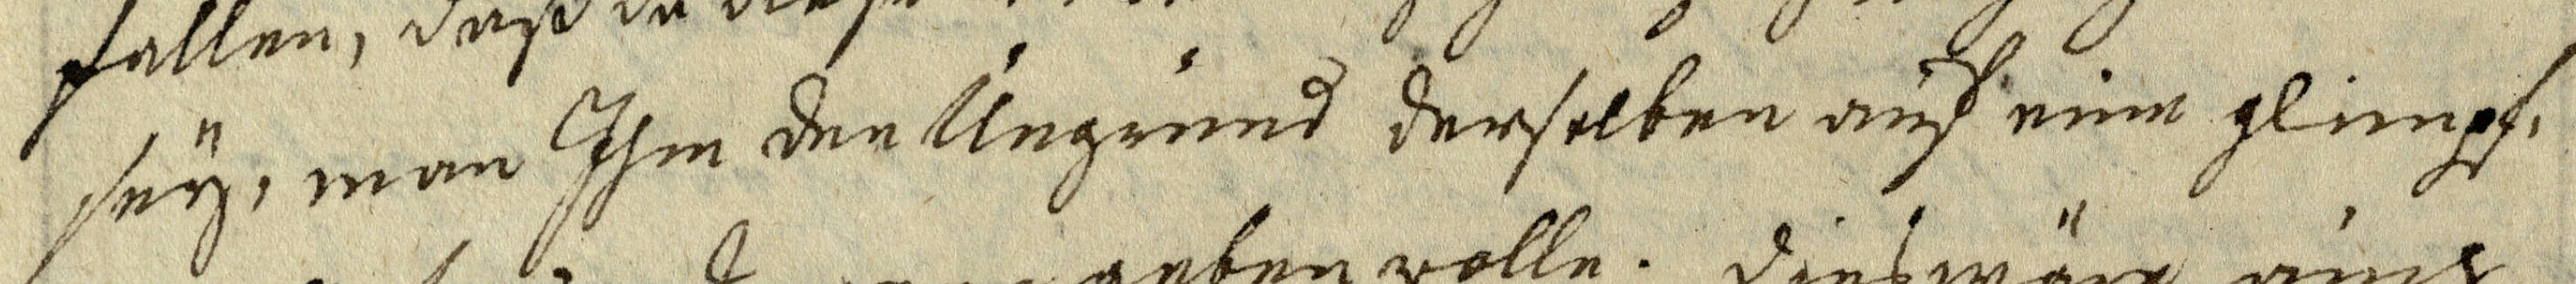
seÿ, man Ihm den Ungrund derselben auf eine glimpf¬
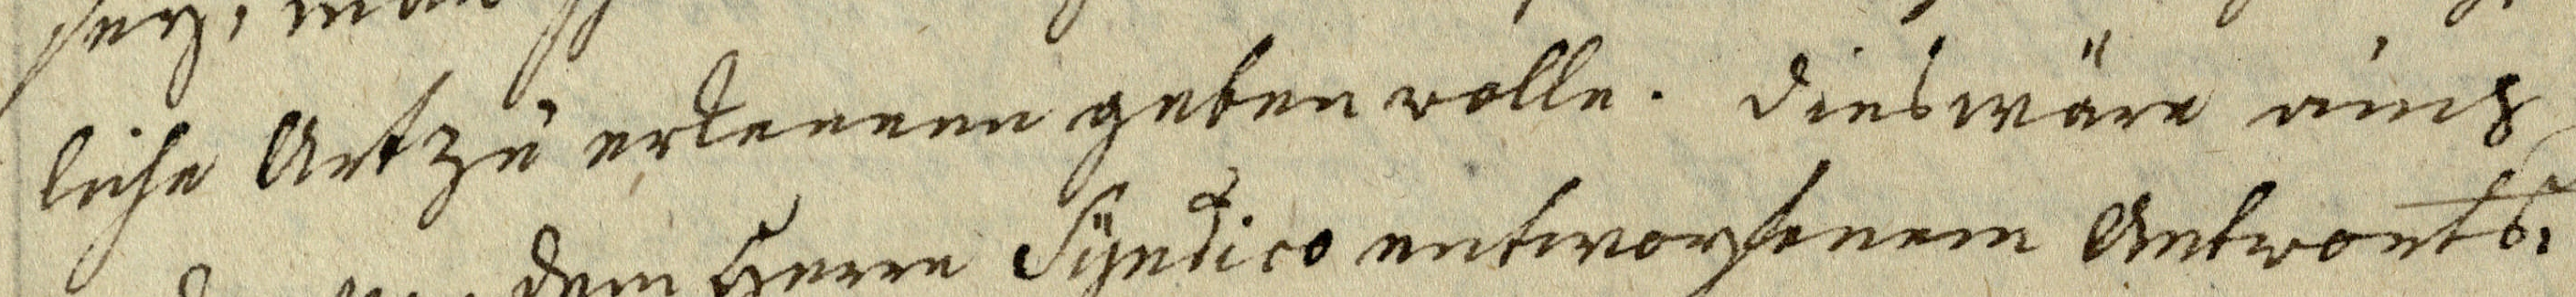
liche Art zu erkennen geben wolle. Dies wäre auch
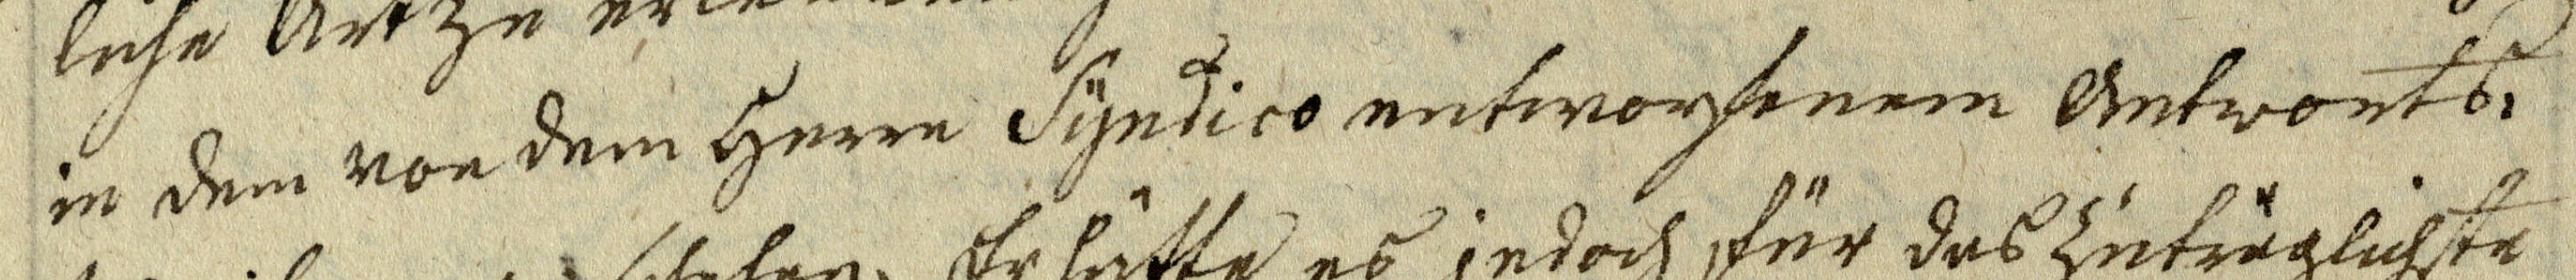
in dem von dem Herrn Sÿndico entworfenem Antworts¬
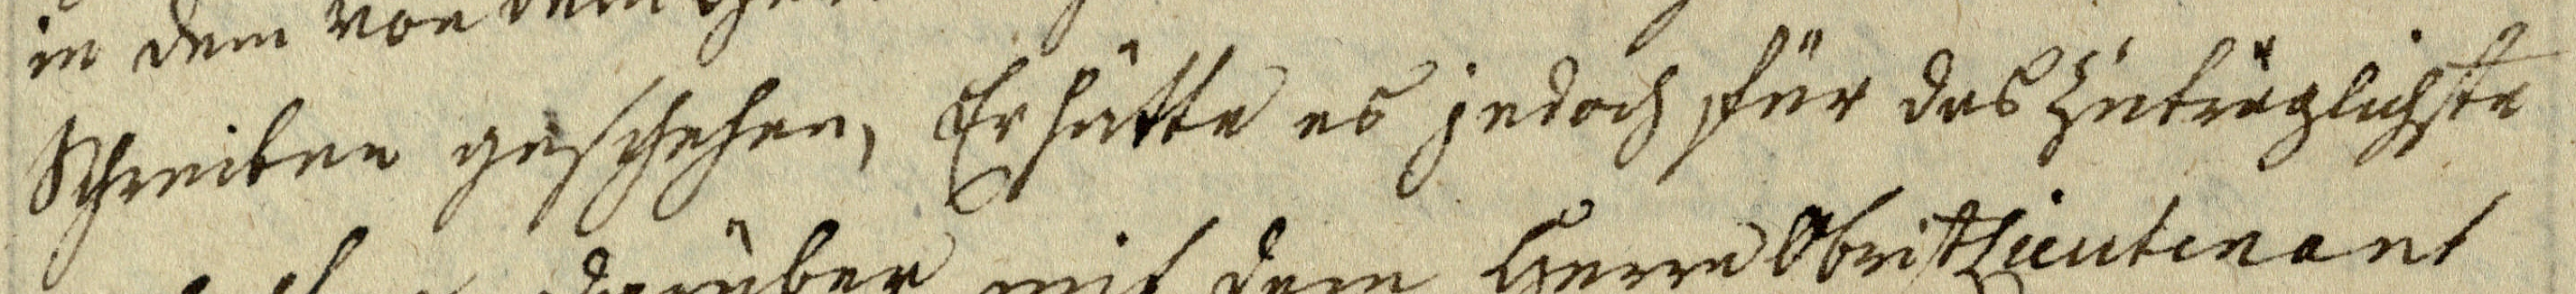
Schreiben geschehen, Er hätte es jedoch für das zuträglichste
